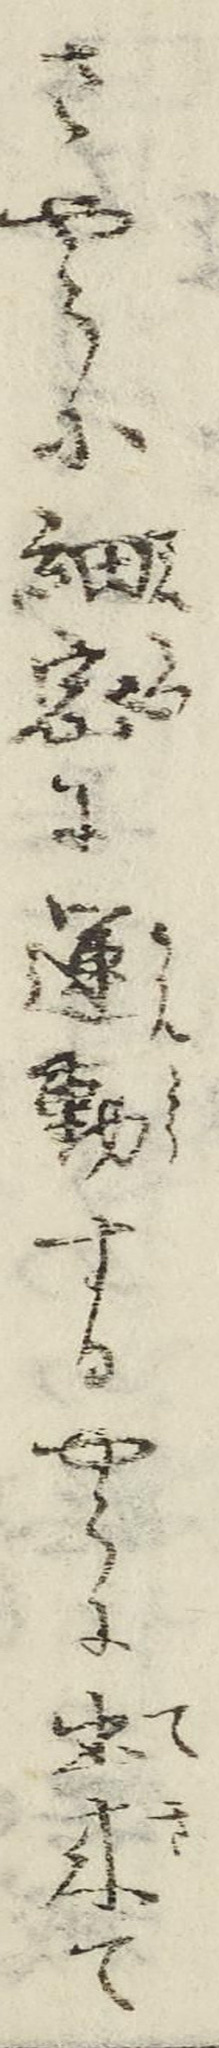さやうに細密に運動するやうに出来て
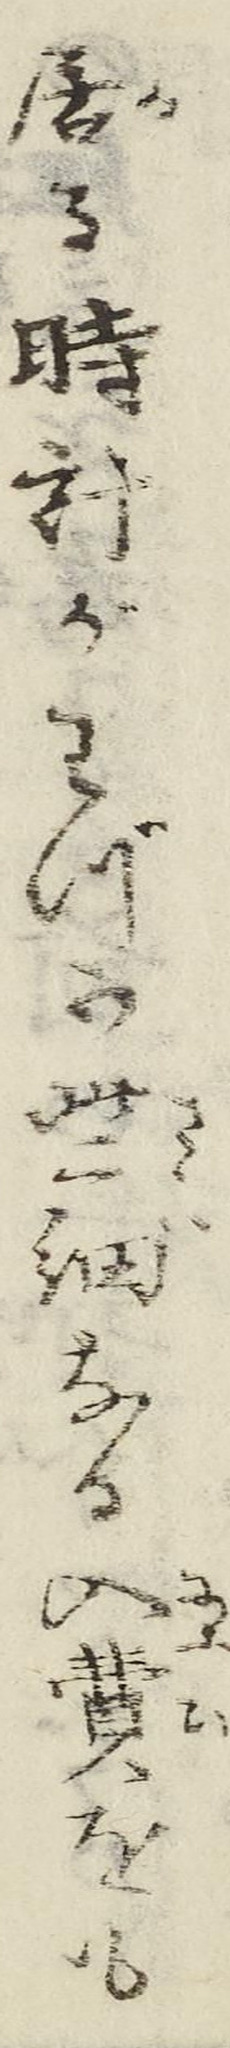居る時計がわづか些細なる入費をも
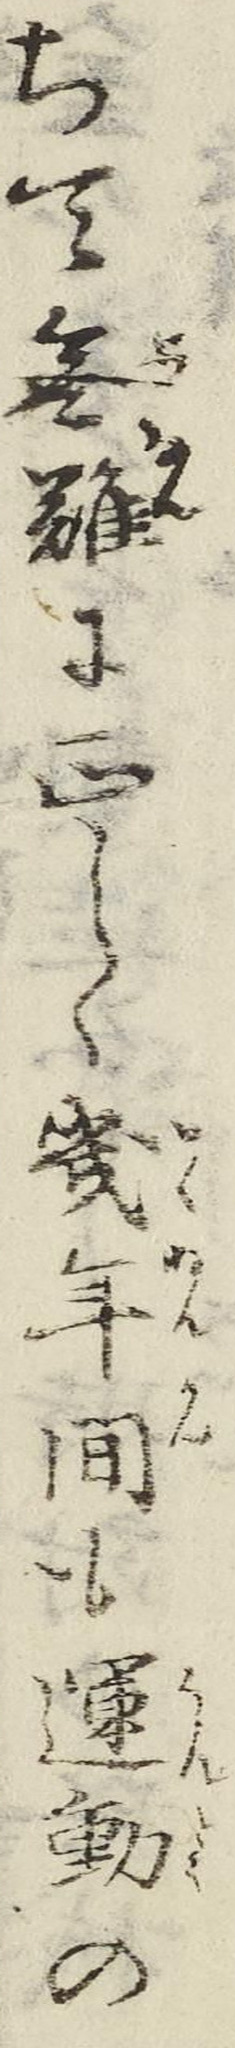ちて無難に正しく幾年間も運動の
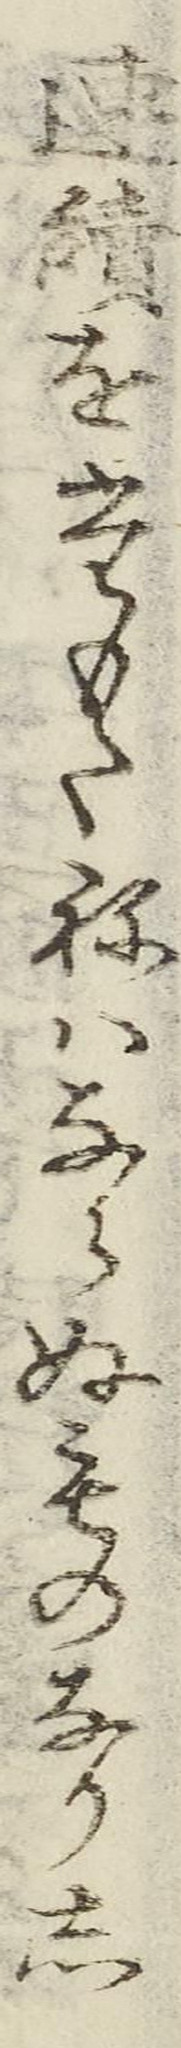連続をたもたねはならぬものなりし
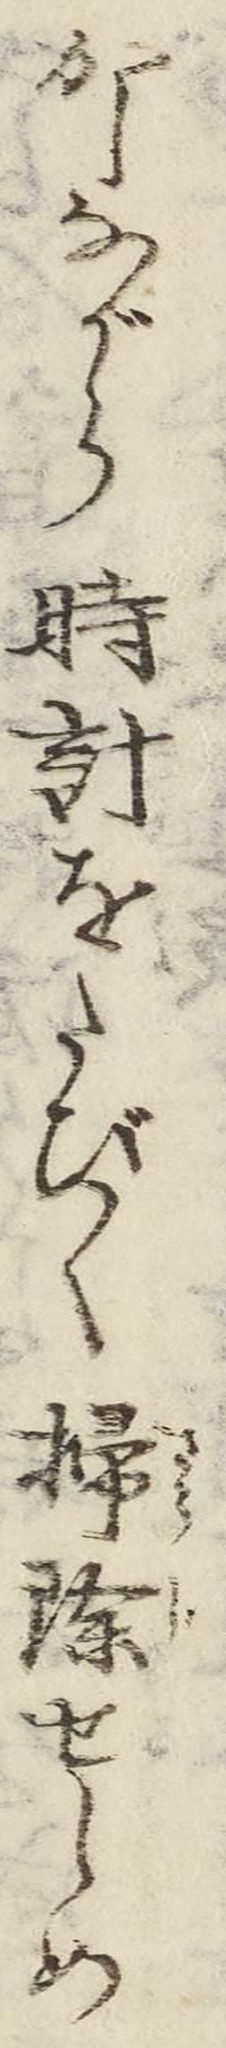かしながら時計をたび〳〵掃除せしめ
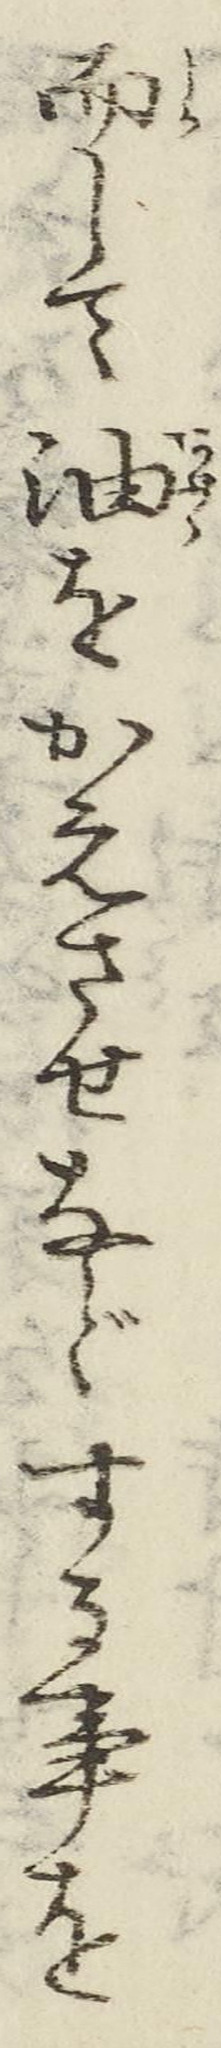而して油をかえさせなどする事を
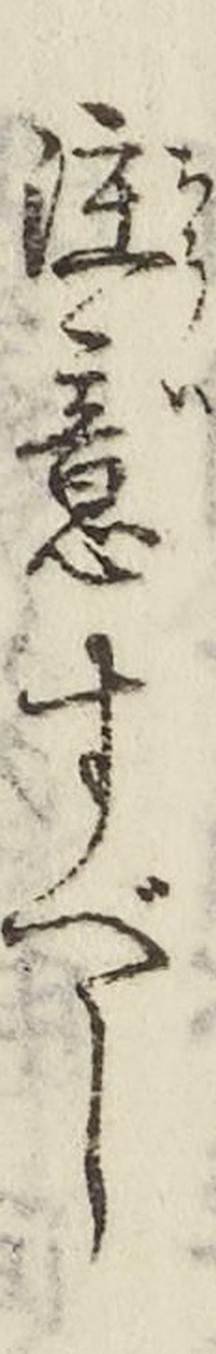注意すべし
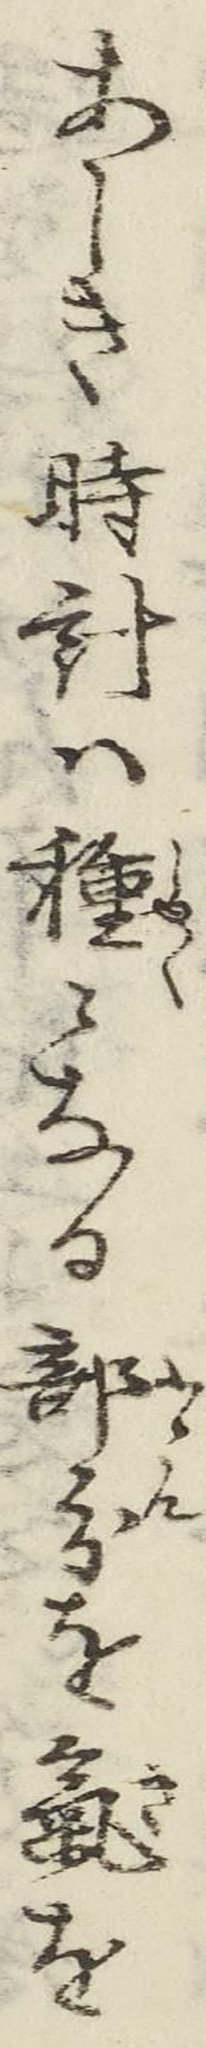あしき時計は種〻なる部分を気を
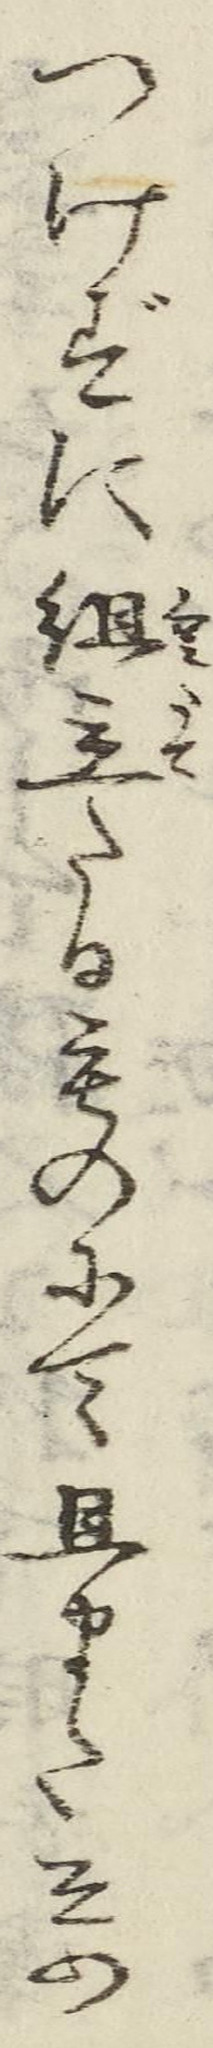つけずに組立たるものにて且またその
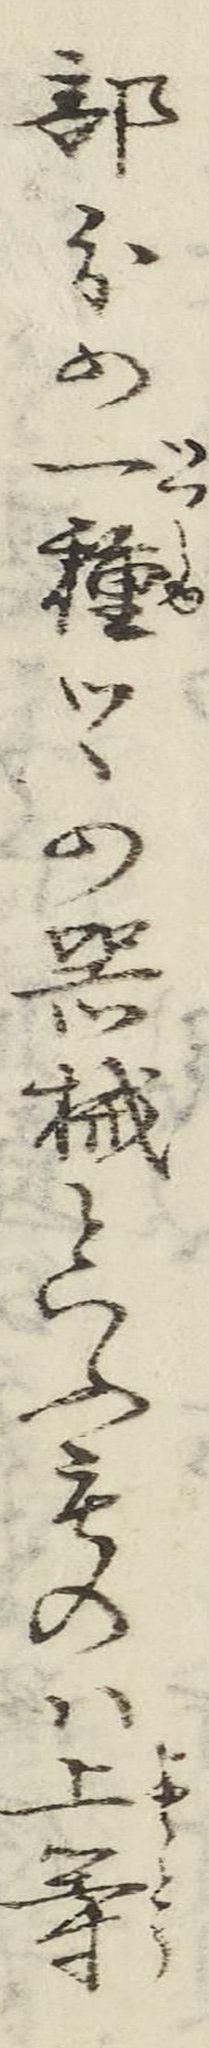部分の一種ツヽの器械といふものは上等
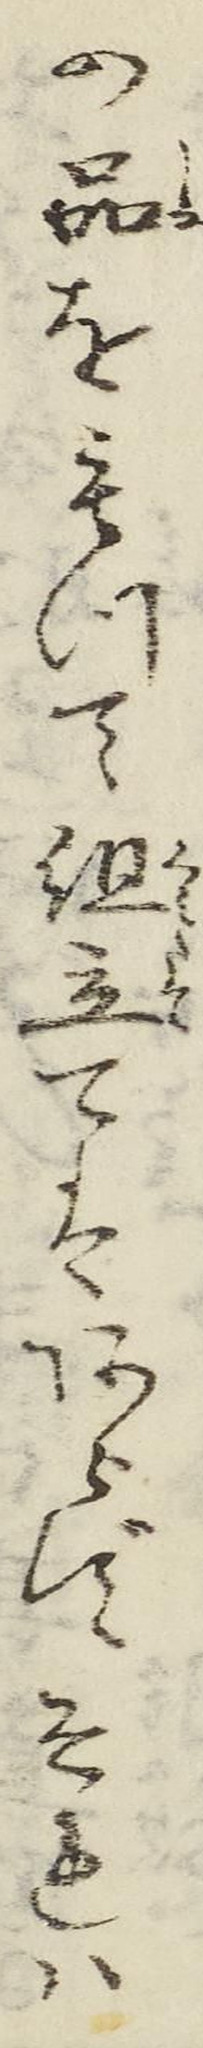の品をもつて組立てはあらずそれは
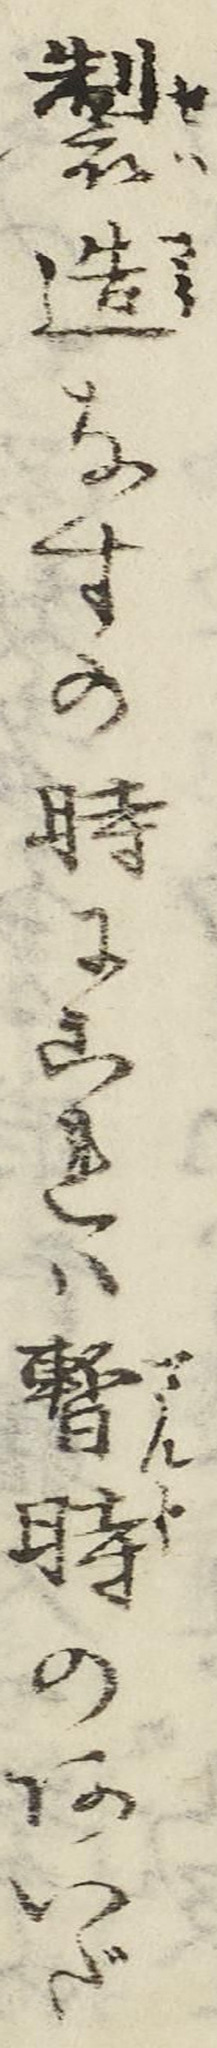製造なすの時にこれは暫時のあいだ
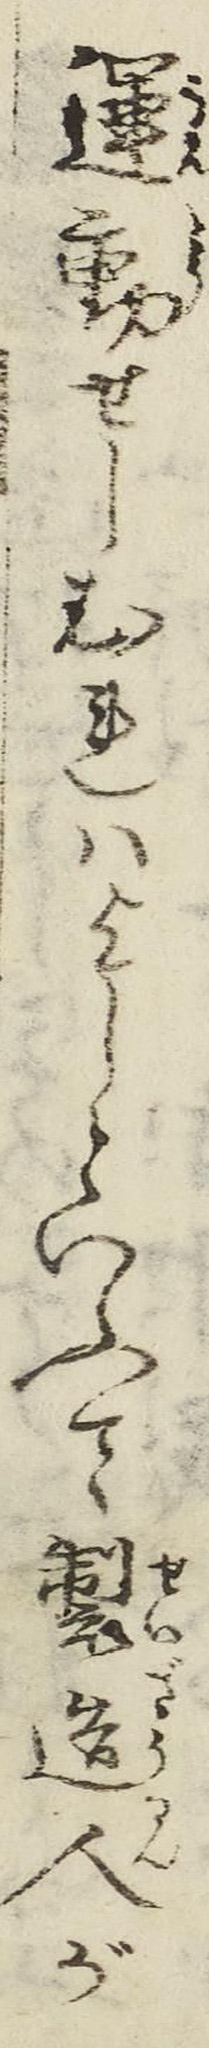運動せしむれはよしといふて製造人が

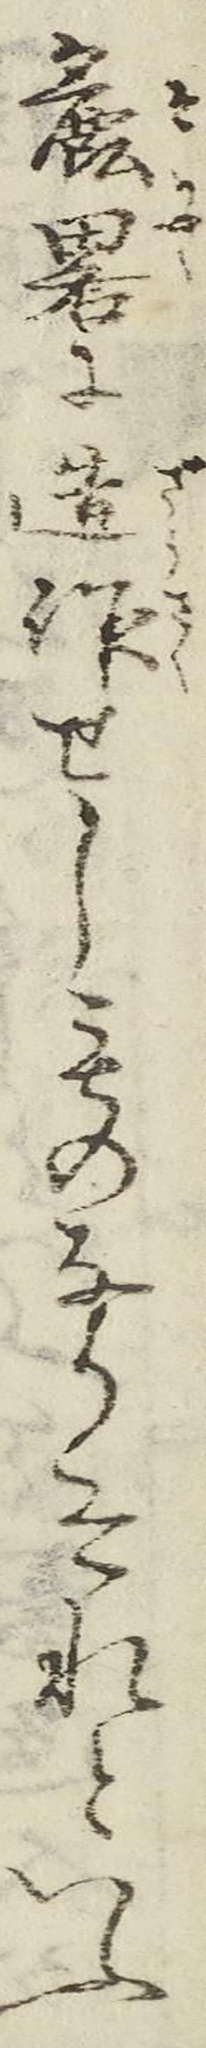粗略に造作せしものなりそれといふ
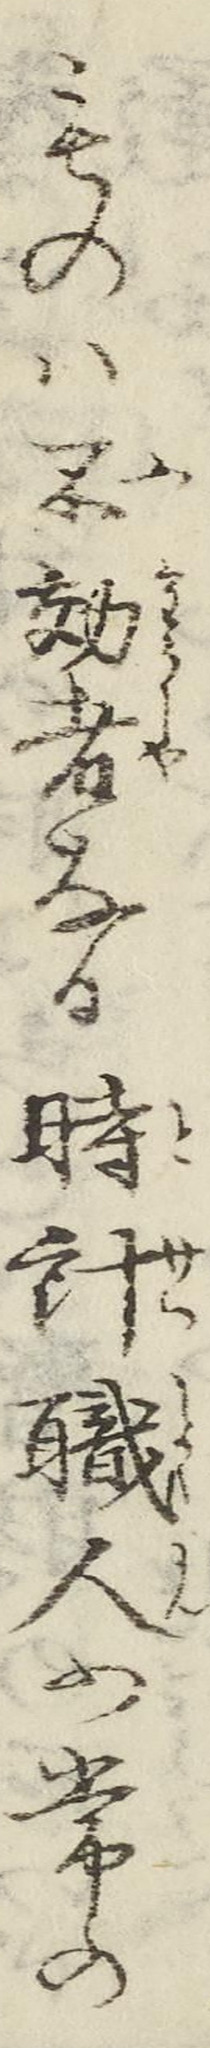ものは不効者なる時計職人の常の
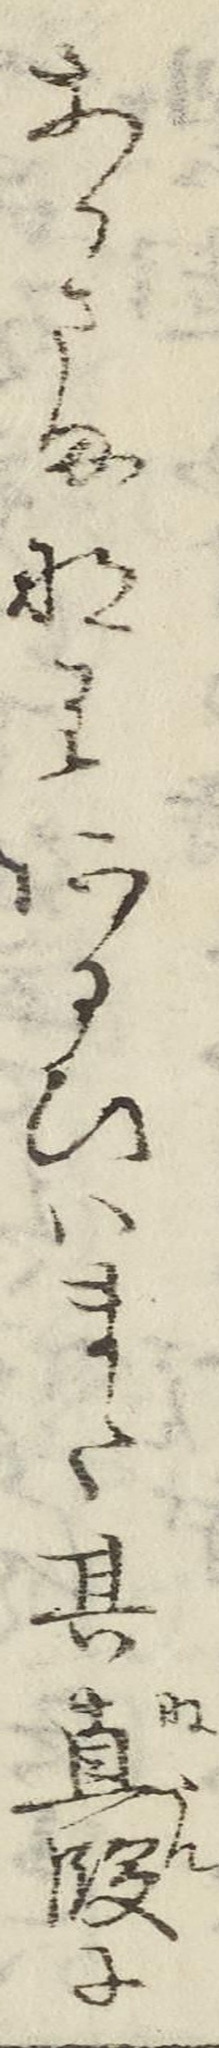ありさまなりあるひはまた其直段に
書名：[時計に関する冊子]
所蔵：東京大学地震研究所図書室 Earthquake Research Institute Library, The University of Tokyo, JAPAN
